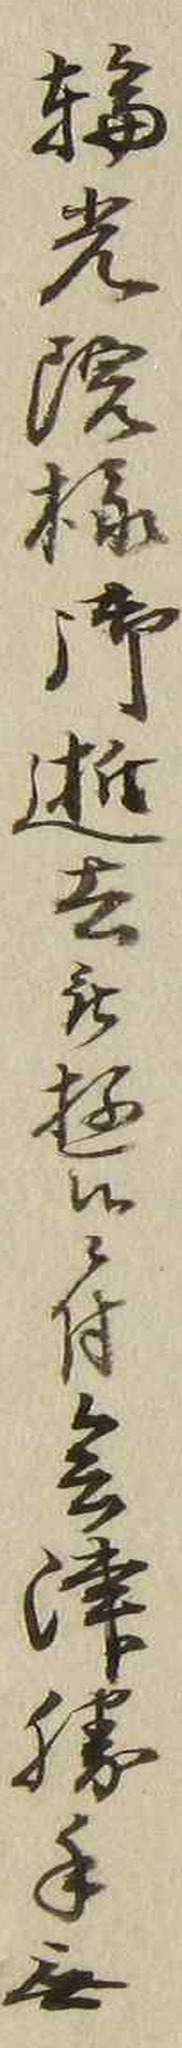輪光院様御逝去被遊候ニ付会津勝手無
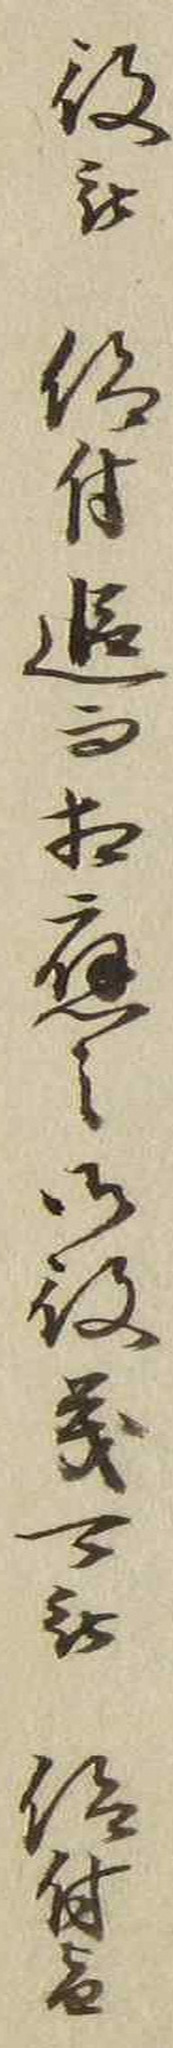役被仰付追而相応之御役義可被仰付旨

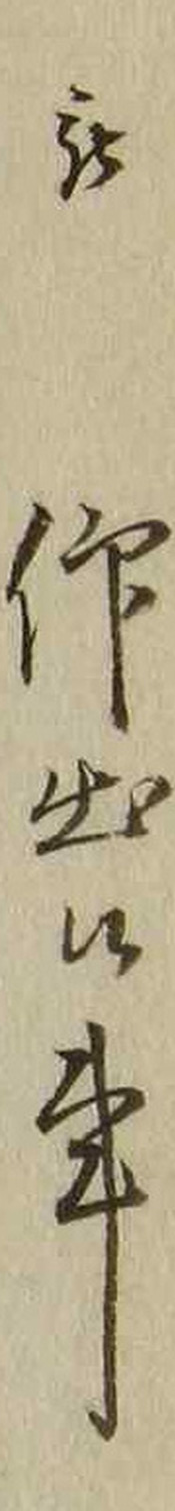被仰出候事
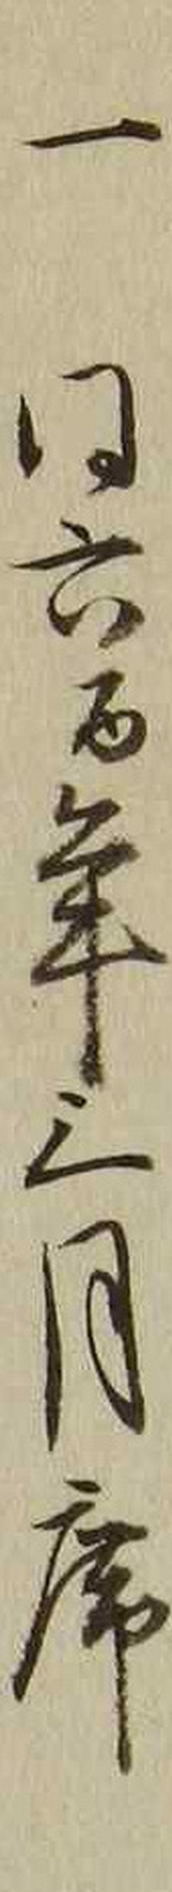一同六酉年三月席
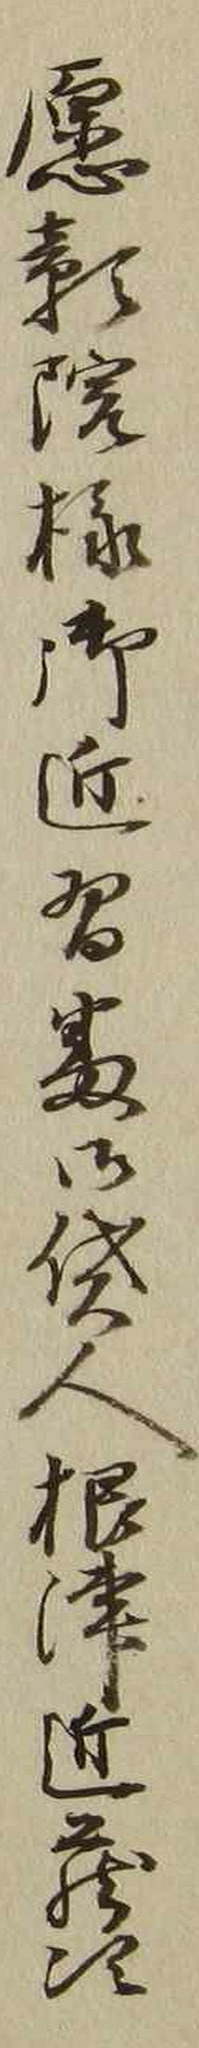愿影院様御近習番御貸人根津近蔵次
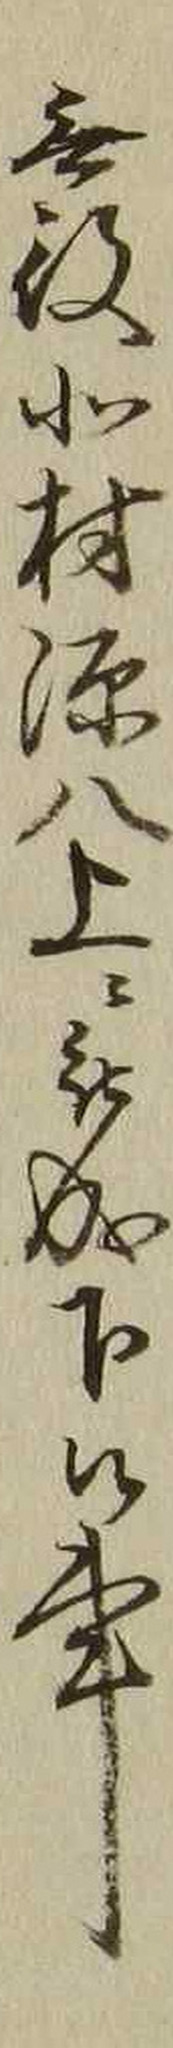無役北村原八上ニ被成下候事
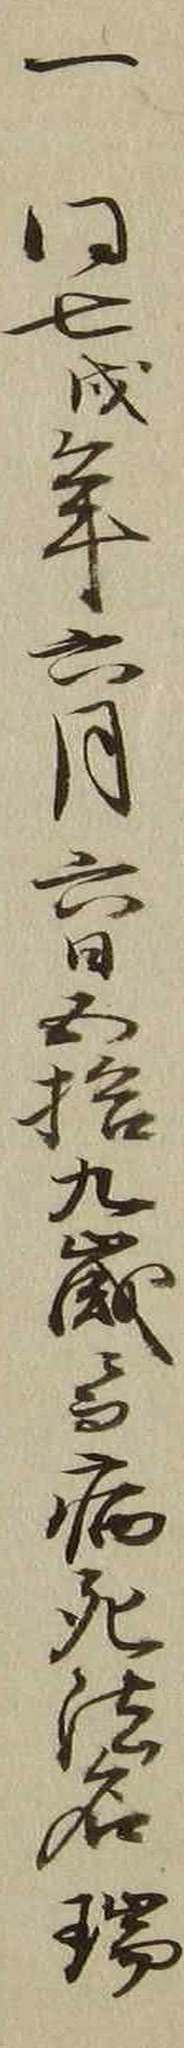一同七戌年六月六日五拾九歳ニ而病死法名瑞
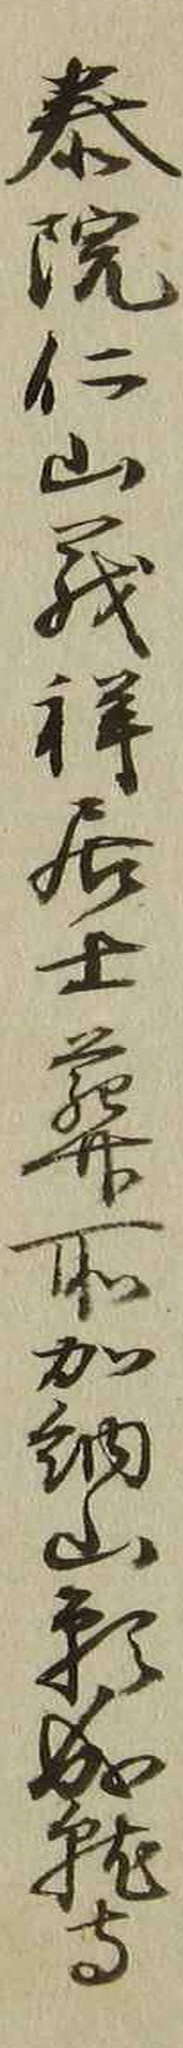泰院仁山義祥居士葬所加納山願成龍寺
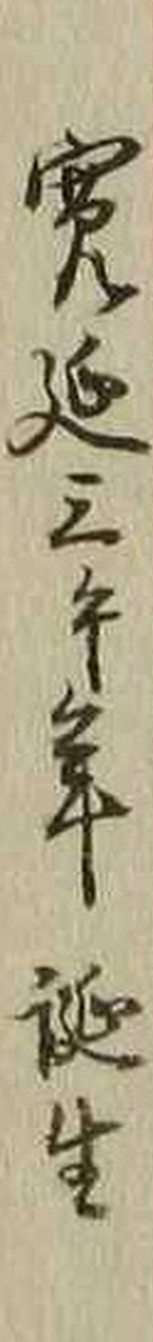寛延三午年誕生
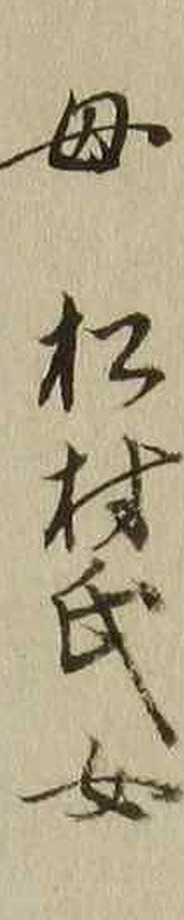母松村氏女
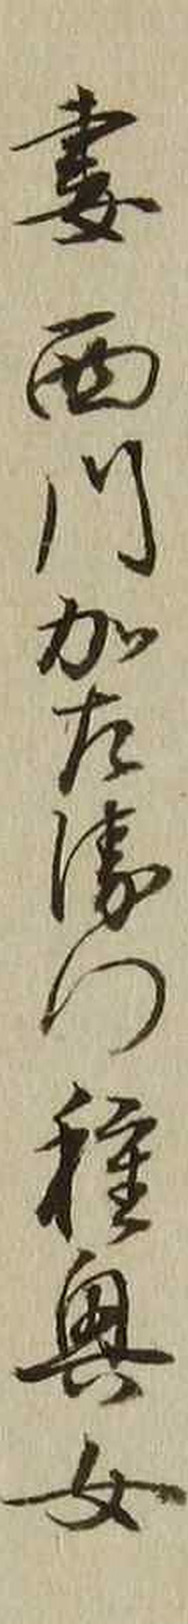妻西川加左衛門種奥女
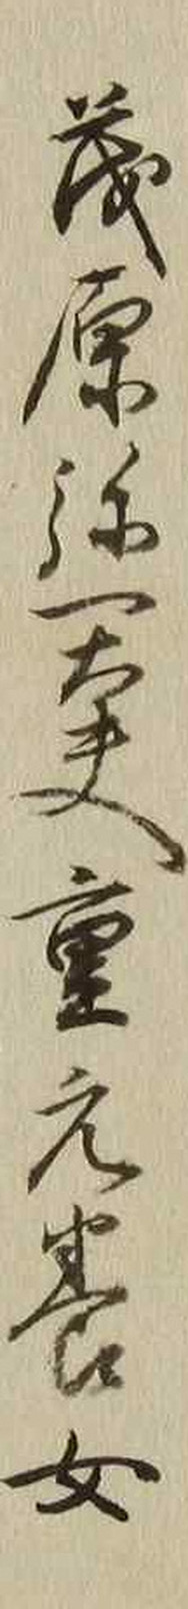茂原弥一太夫重元養女
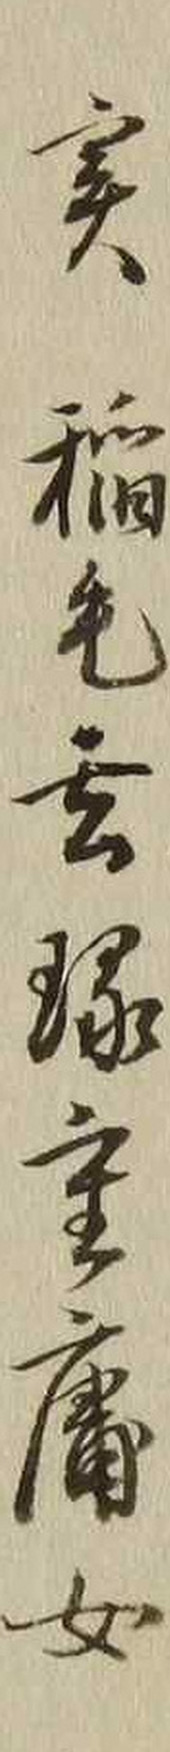実稲毛玄録重庸女
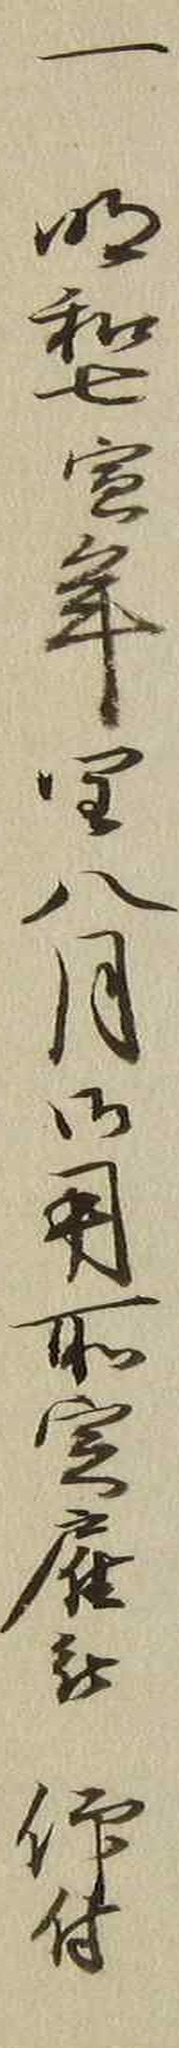一明和七寅年閏八月御用所定雇被仰付
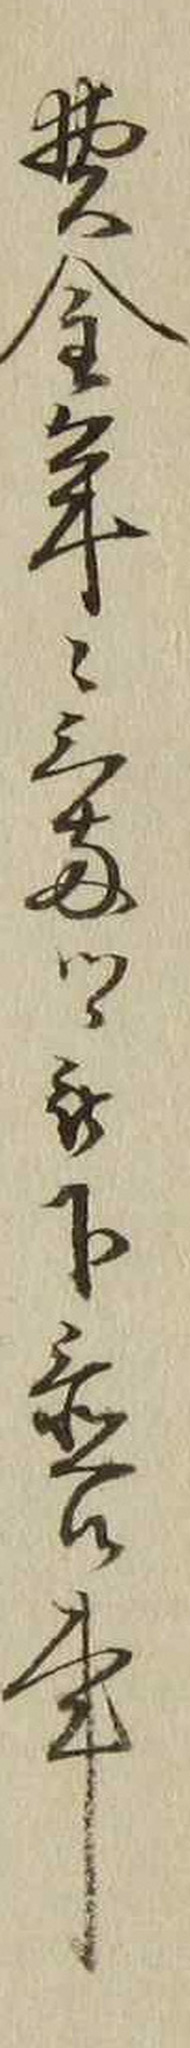貫金年ニ三両ツヽ被下置候事
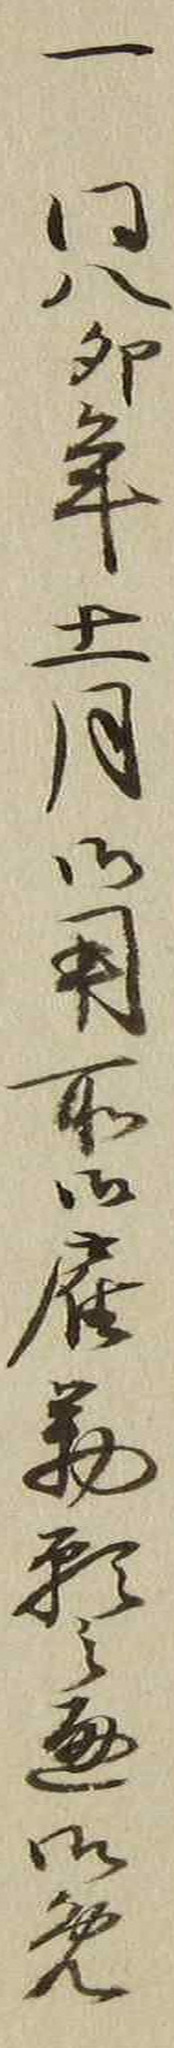一同八夘年十一月御用所御雇勤願之通御免
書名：諸士系譜　巻之114　か之部22
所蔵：会津若松市立会津図書館
